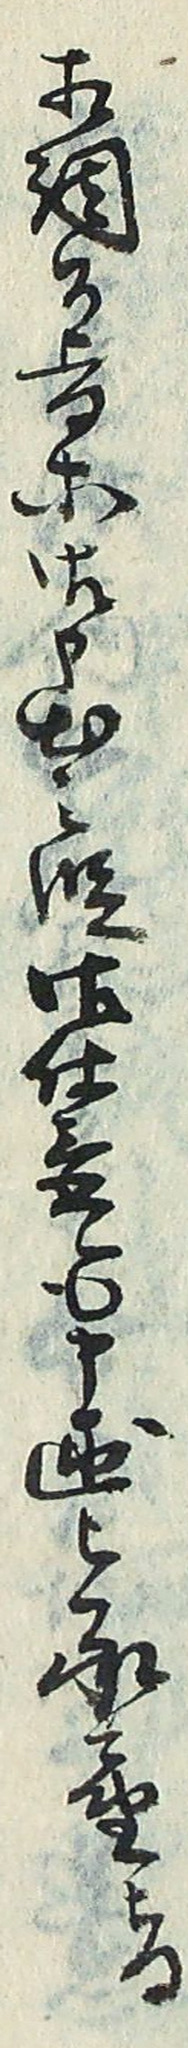相調候旨等御申出之段御仕置も申述被承御坐候旨
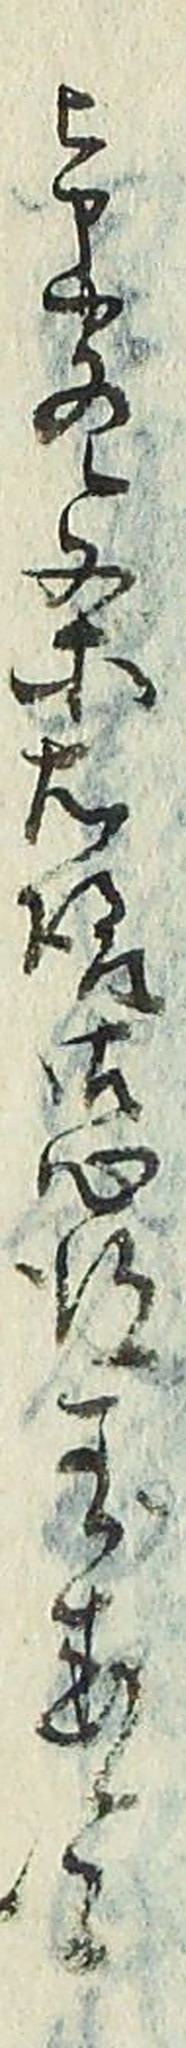被申聞候条左様相心得可被成候以上
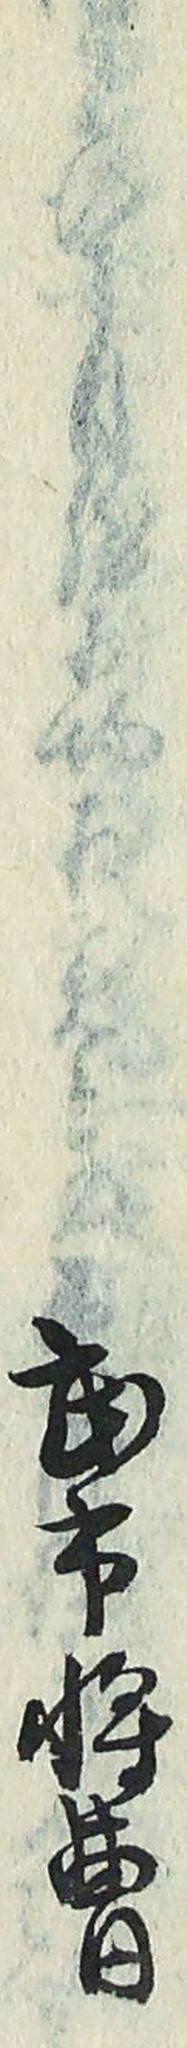武市将曹
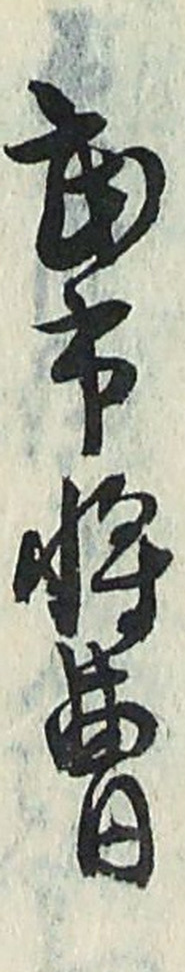武市将曹
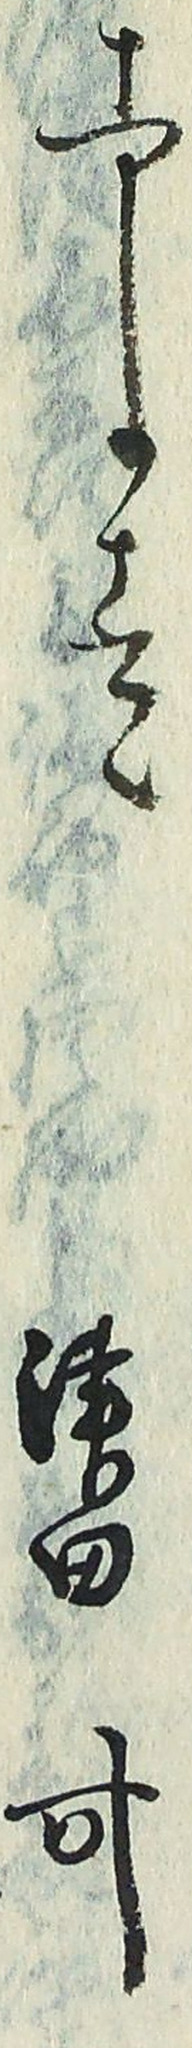十一月十六日津田叶
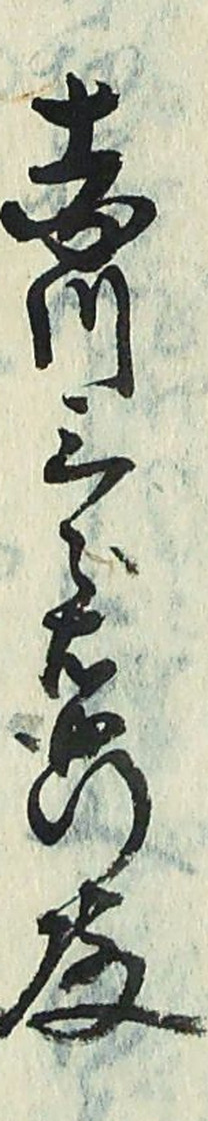赤川三郎右衛門殿
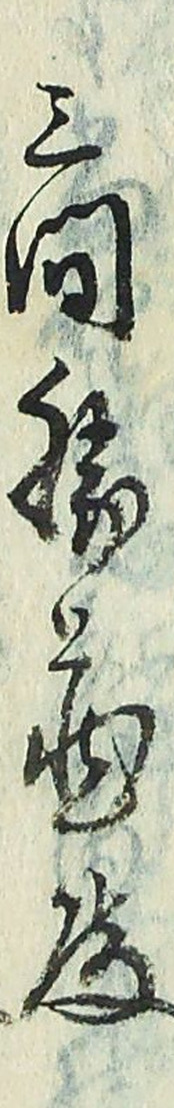三間勝蔵殿
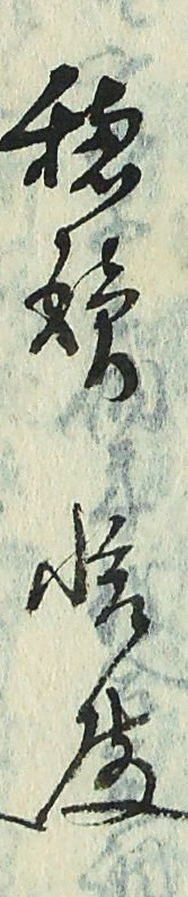穂積恰殿
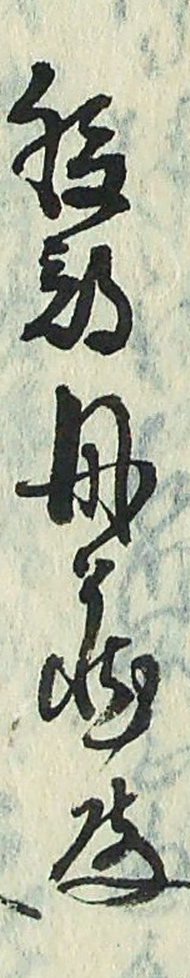服部丹蔵殿
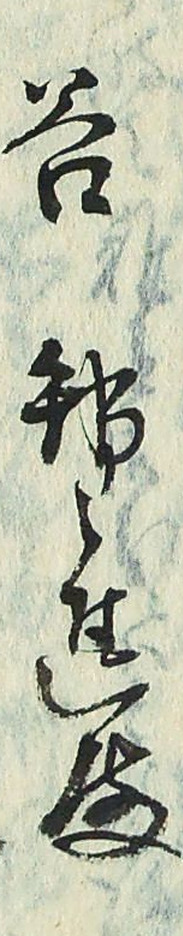谷邦之進殿
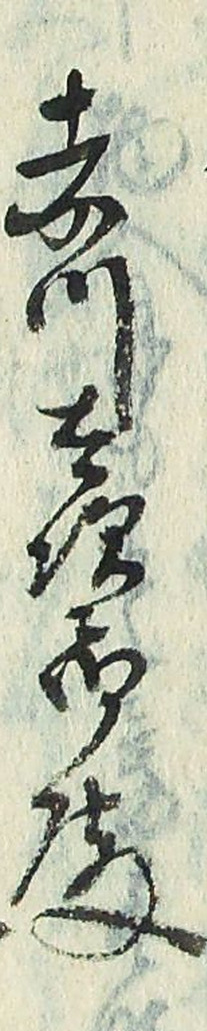赤川太次郎殿
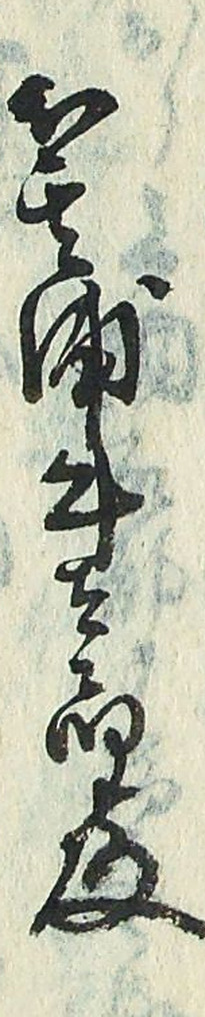箕浦牛太郎殿

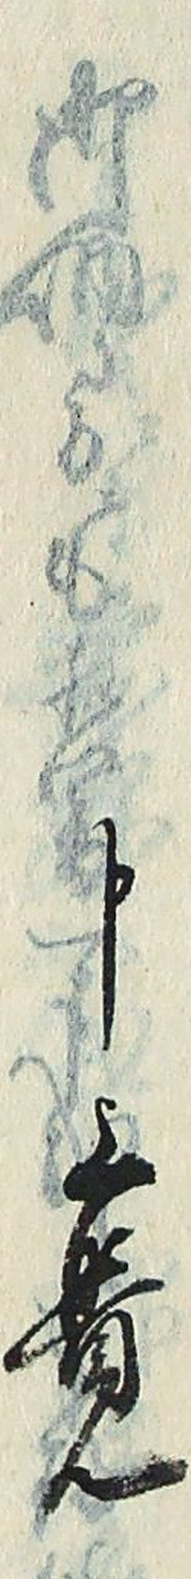申上覺
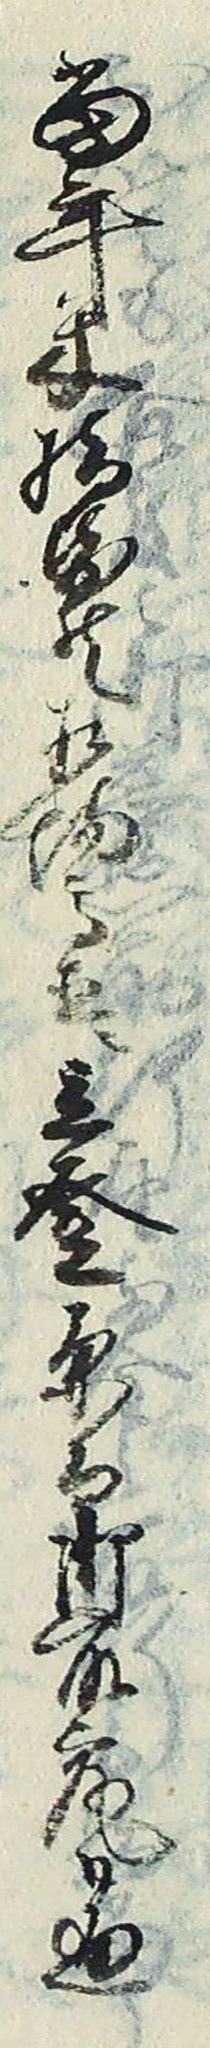當年米指帋共相場高直ニ立登兼而御取究候通
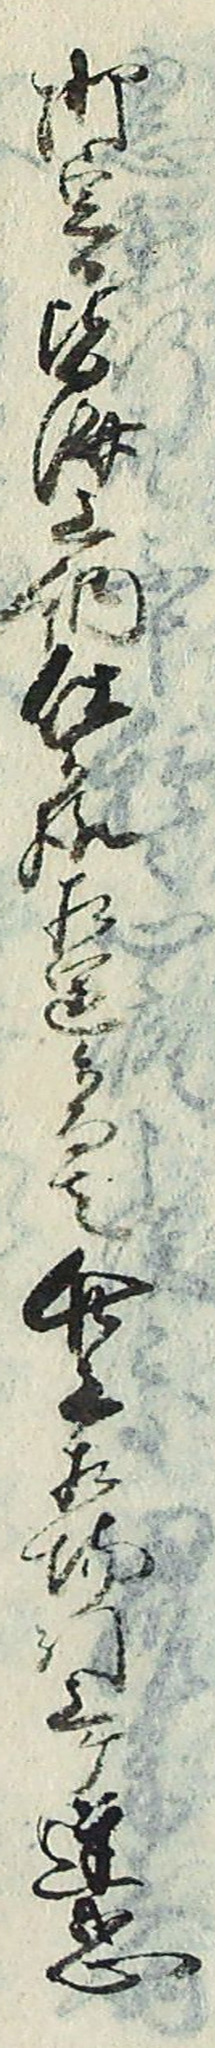御定日皆済上納仕候様相運候而者此上相場引上ケ迷惑
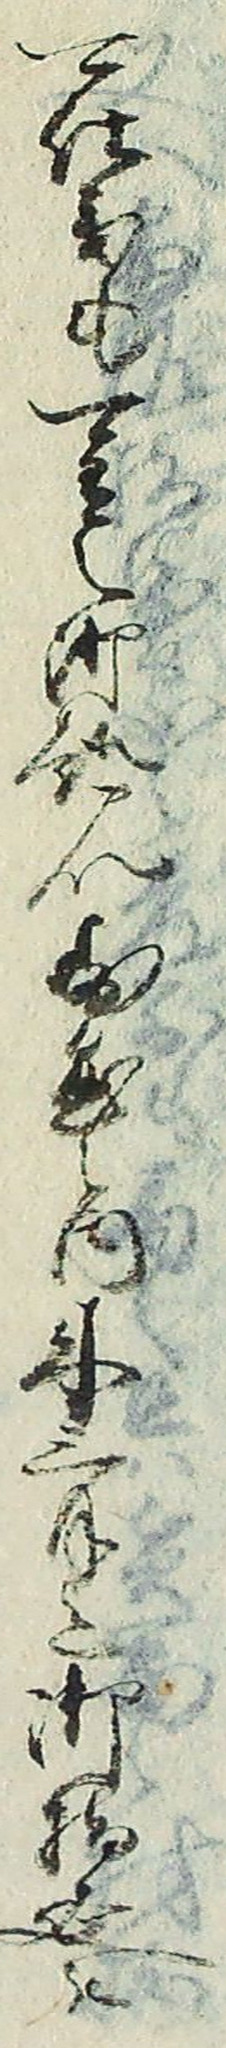可仕義も可有之御趣ヲ以歩懸之内来三月迄御指延被
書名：諸御趣意書并御下知向之写
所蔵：鳴門教育大学 Naruto University of Education
